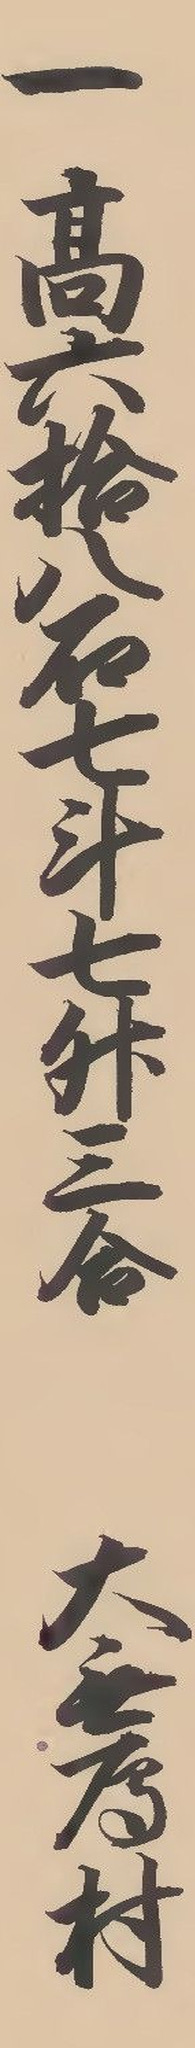一高六拾八石七斗七升三合大無雁村

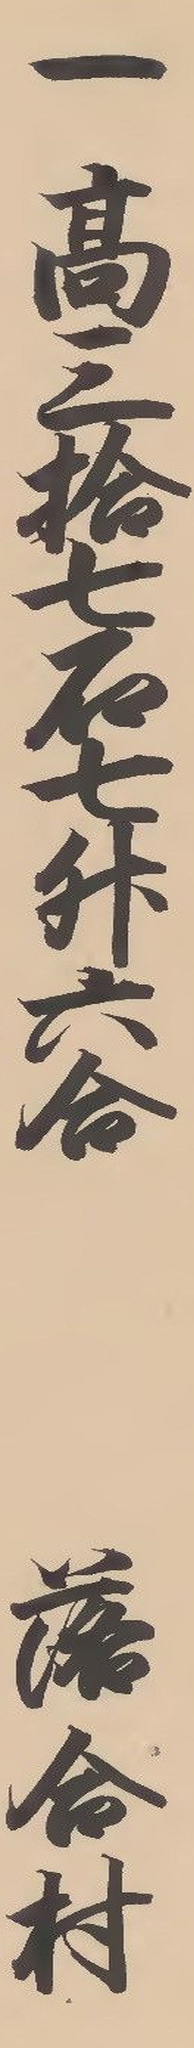一高三拾七石七升六合落合村
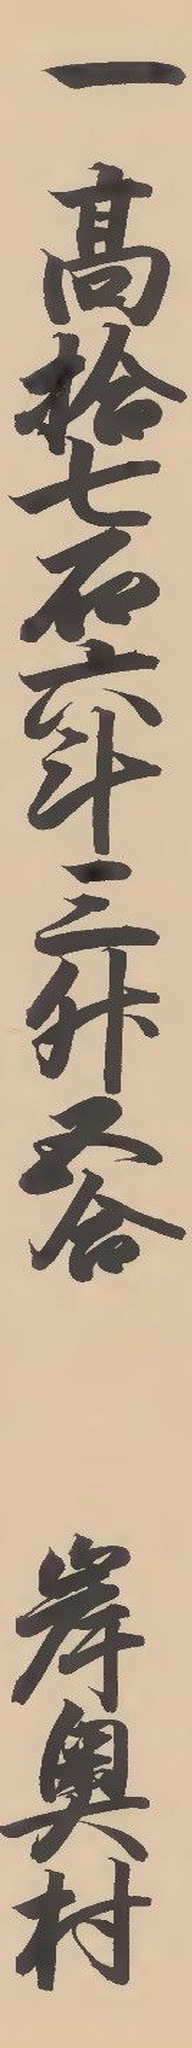一高拾七石六斗三升五合岸奥村
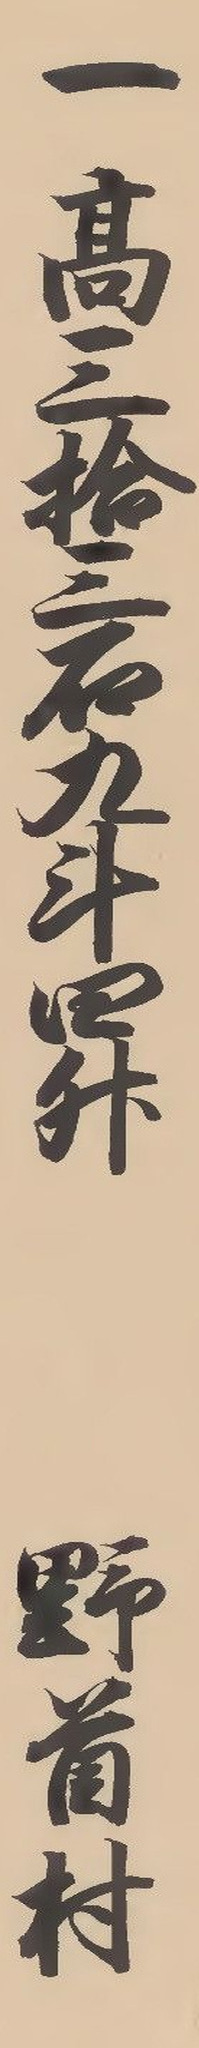一高三拾三石九斗四升野首村
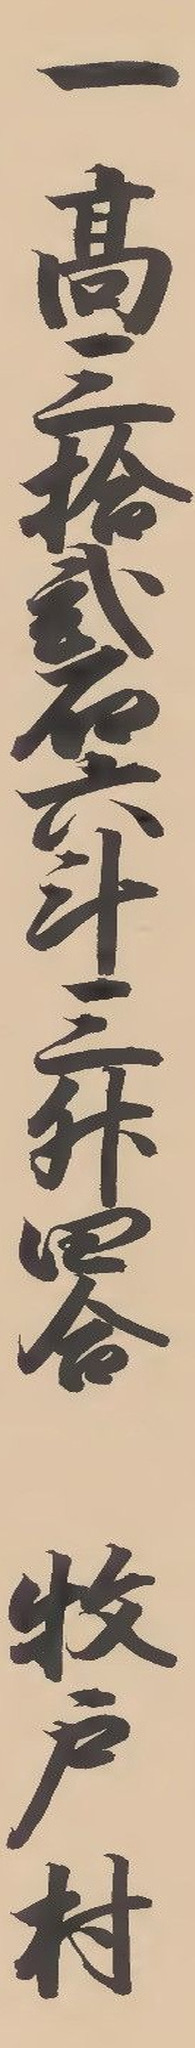一高三拾弐石六斗三升四合牧戸村
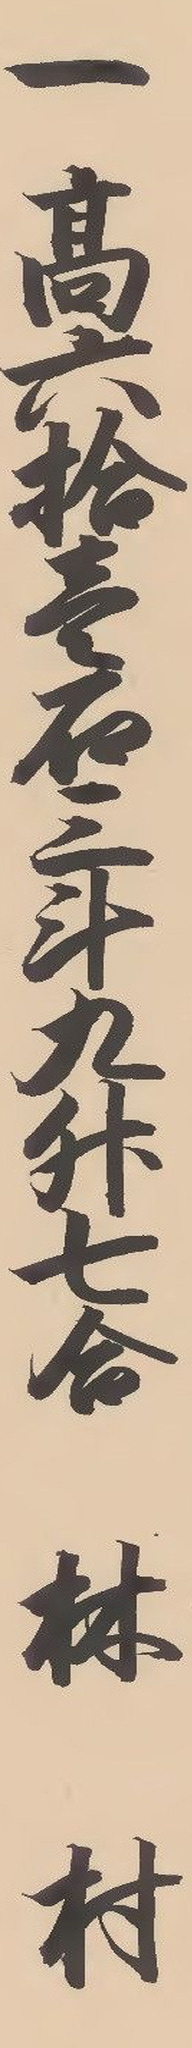一高六拾壱石三斗九升七合林村
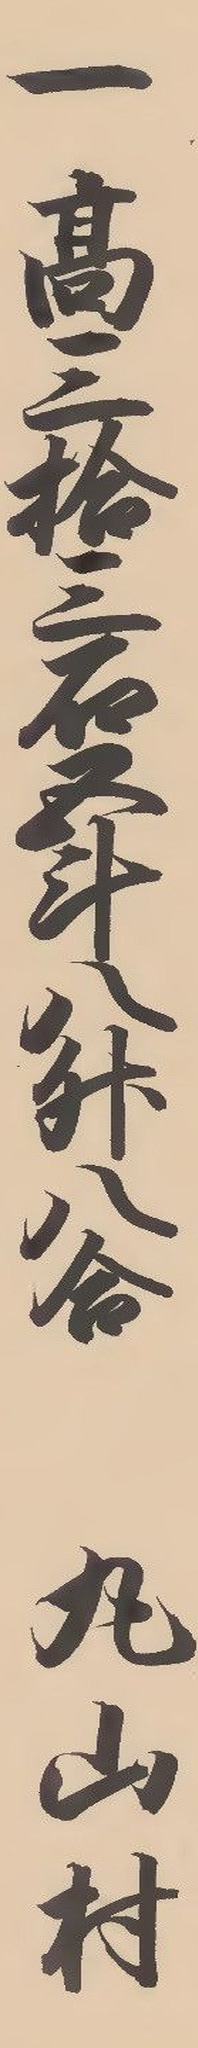一高三拾三石五斗八升八合丸山村
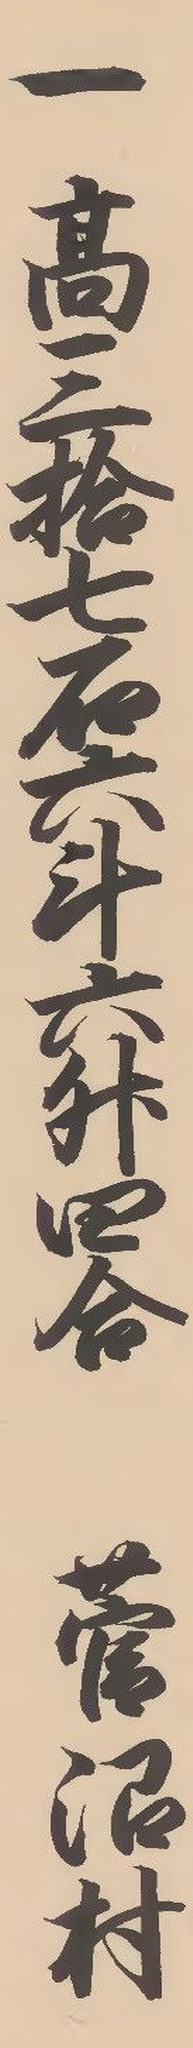一高三拾七石六斗六升四合菅沼村

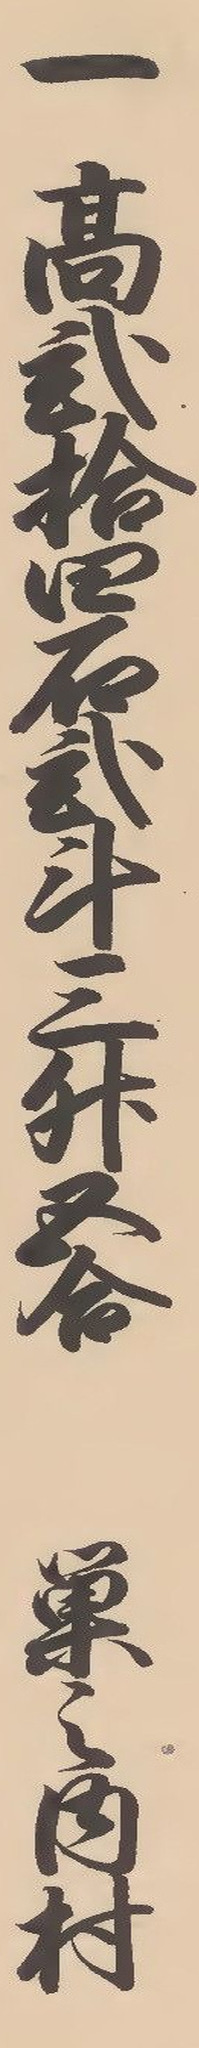一高弐拾四石弐斗三升五合巣之内村
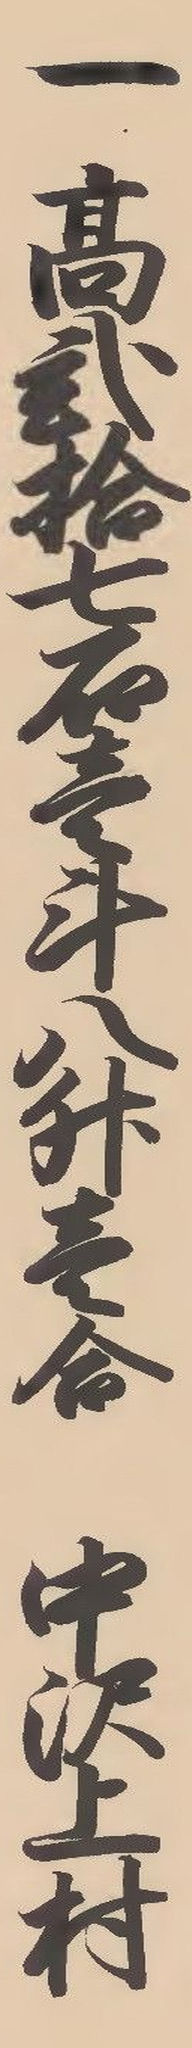一高弐拾七石壱斗八升壱合中沢上村
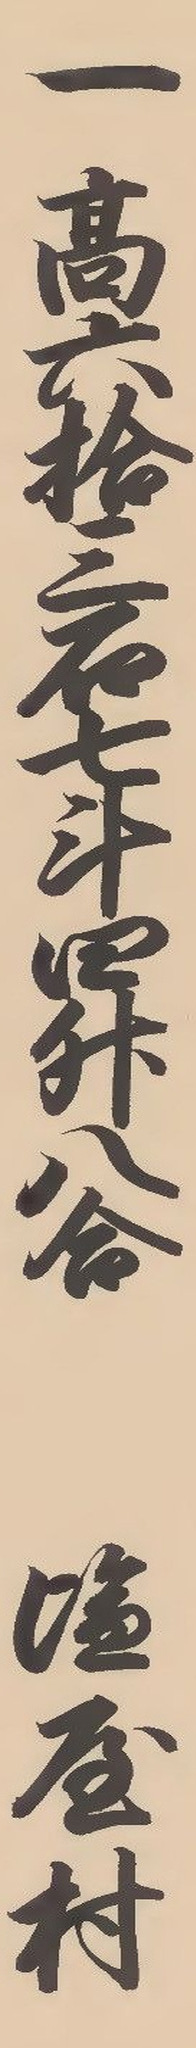一高六拾三石七斗四升八合塩屋村
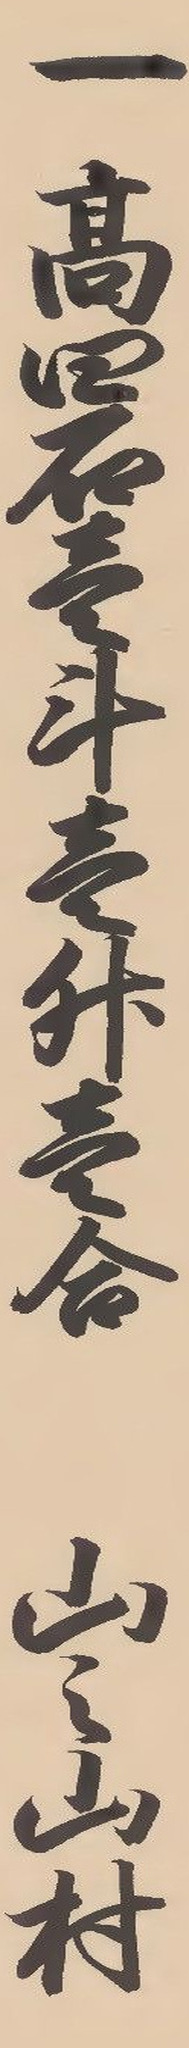一高四石壱斗壱升壱合山之山村
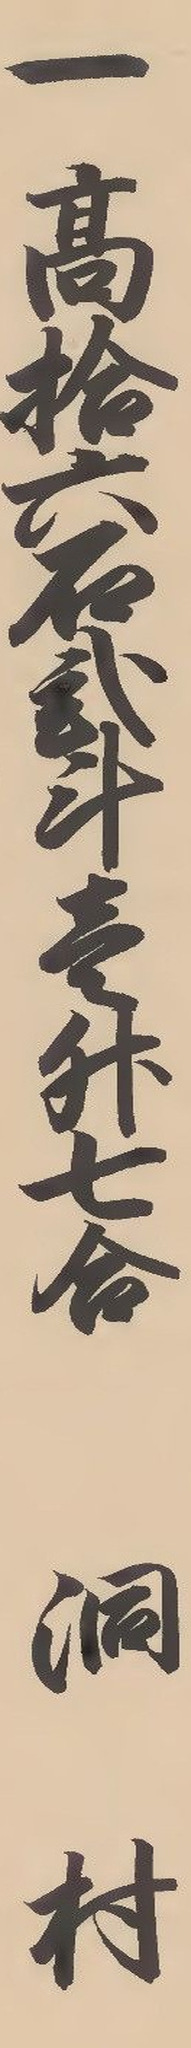一高拾六石弐斗壱升七合洞村
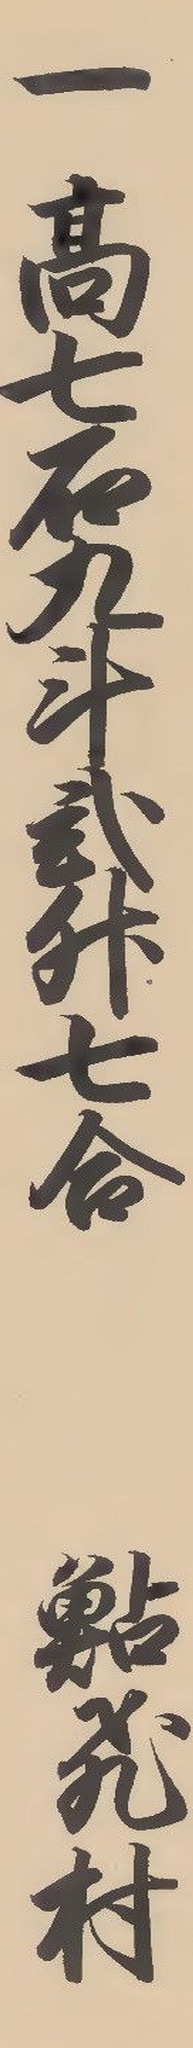一高七石九斗弐升七合鮎飛村
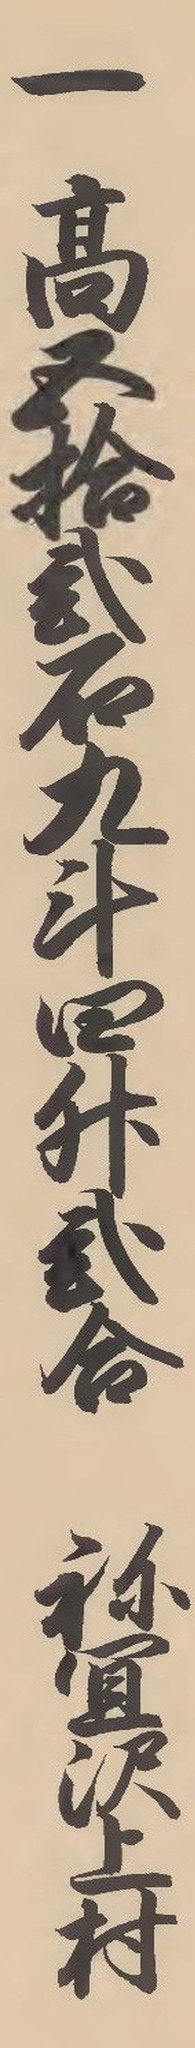一高五拾弐石九斗四升弐合祢宜沢上村
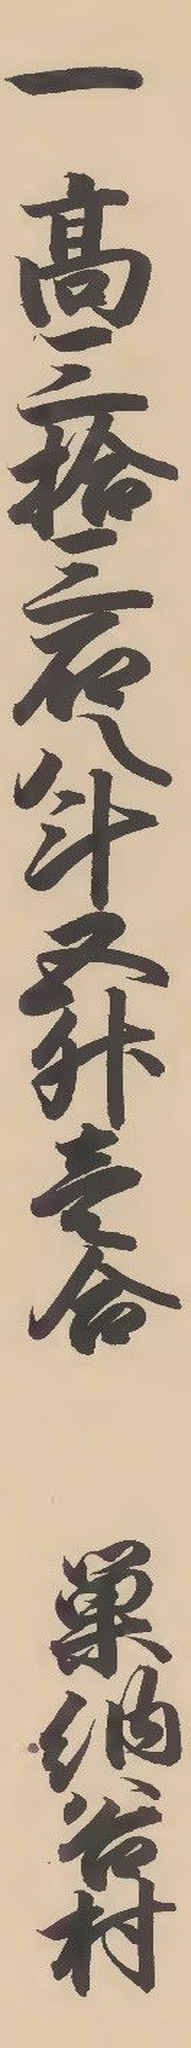一高三拾三石八斗五升壱合巣納谷村
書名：飛騨国郷帳
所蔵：国立公文書館 National Archives of Japan
